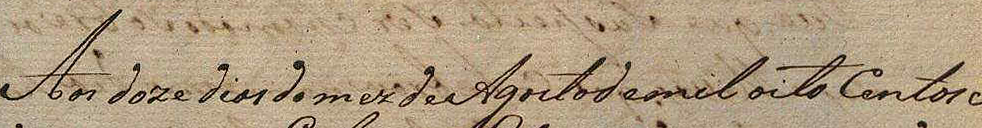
Aos doze dias do mez de Agosto de mil oito Centos e
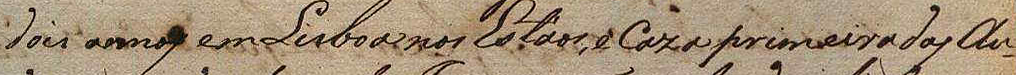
dois annos em Lisboa nos Estáos, e Caza primeira das Au
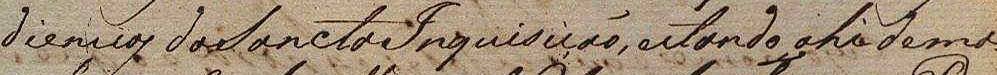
diencias da Sancta Inquisiçaõ, estando ahi de ma
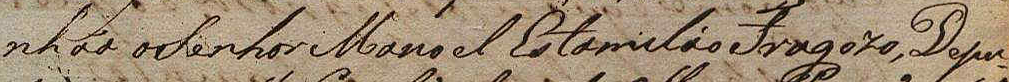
nhãa o Senhor Manoel Estanisláo Fragozo, Depu
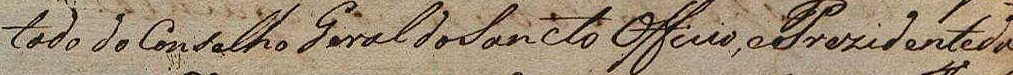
tado do Conselho Geral do Sancto Officio, e Presidente da
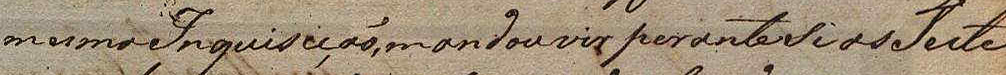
mesma Inquisiçaõ, mandou vir perante si as Teste
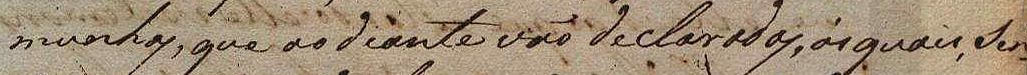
munhas, que ao diante vaõ declaradas, às quais, sen
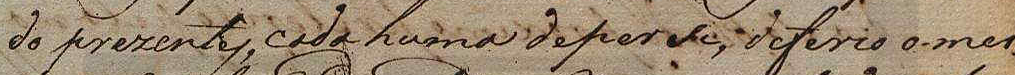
do prezentes, cada huma de per si, deferio o mes
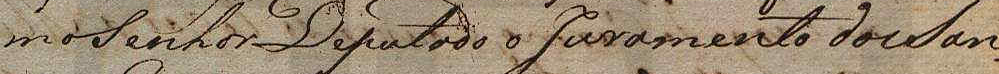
mo Senhor Deputado o Juramento dos San
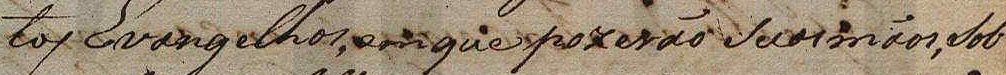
tos Evangelhos, em que pozeraõ suas mãos, sob
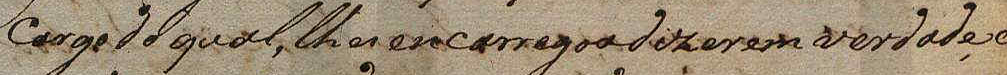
Cargo do qual, lhes encarregou dizerem verdade, e
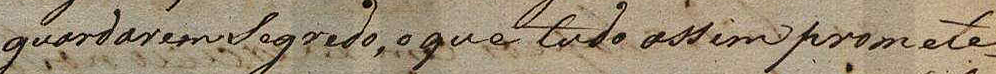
guardarem segredo, o que tudo assim promete
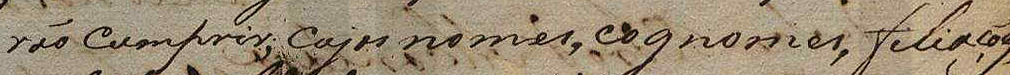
raõ cumprir, cujos nomes, cognomes, filiações
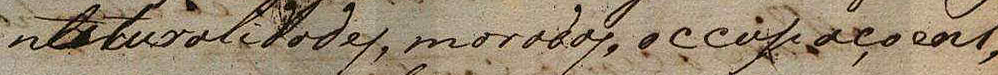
naturalidades, moradas, occupaçoens,
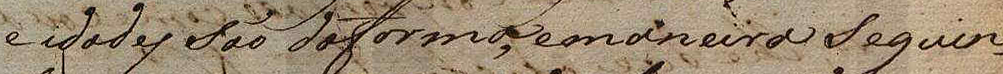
e idades saõ da forma, e maneira seguin
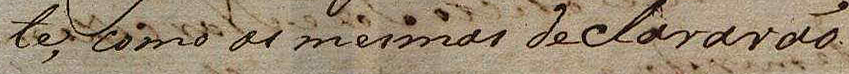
te, como os mesmos declararaõ.
